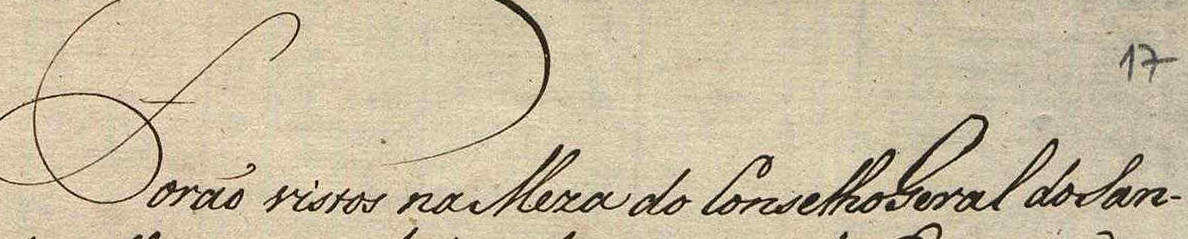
Foraõ vistos na Meza do Conselho Geral do San
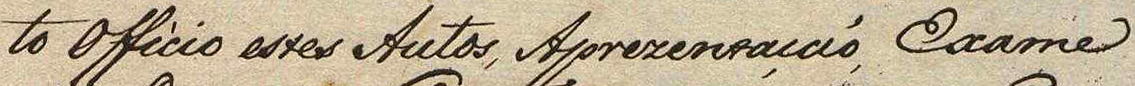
to Officio estes Autos, Aprezentaçaõ, Exame
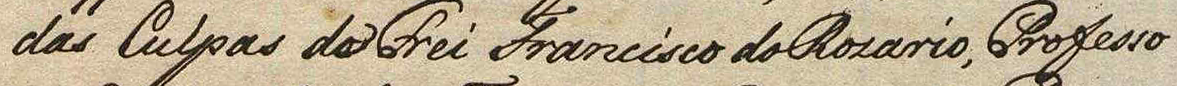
das Culpas de Frei Francisco do Rozario, Professo
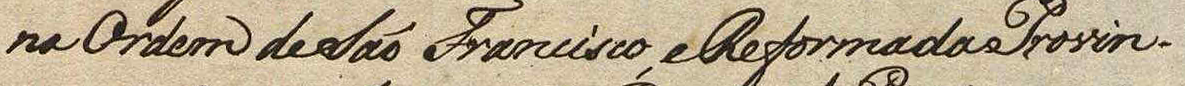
na Ordem de Saõ Francisco, e Reformada Provin
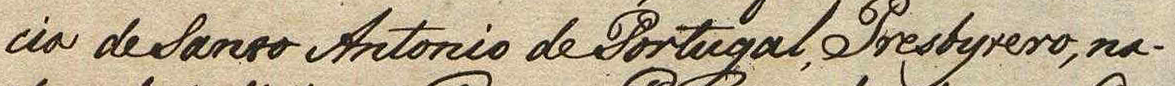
cia de Santo Antonio de Portugal, Presbytero, na
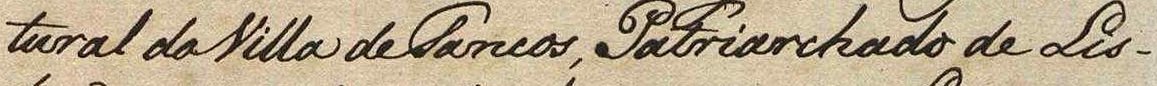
tural da Villa de Tancos, Patriarchado de Lis
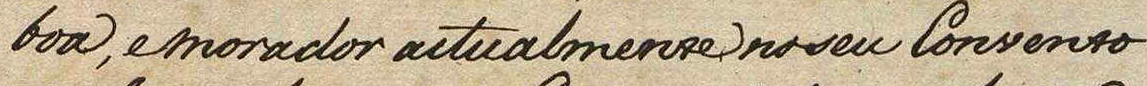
boa, e morador actualmente no seu Convento
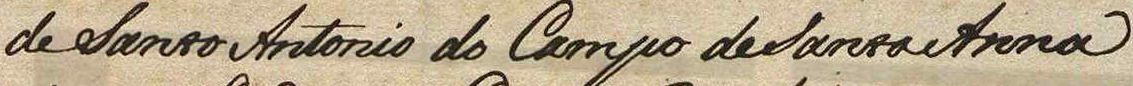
de Santo Antonio do Campo de Santa Anna
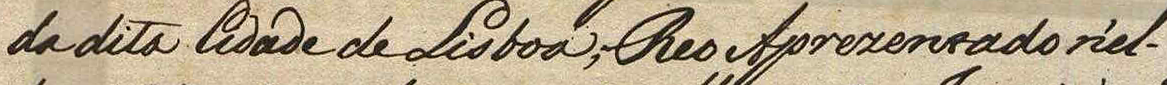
da dita Cidade de Lisboa, Reo aprezentado nel
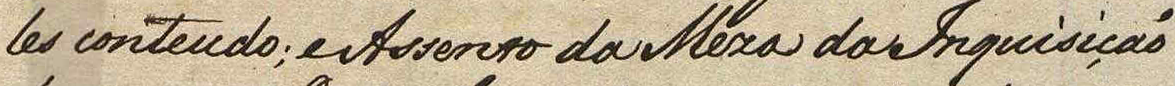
les conteudo; e Assento da Meza da Inquisiçaõ
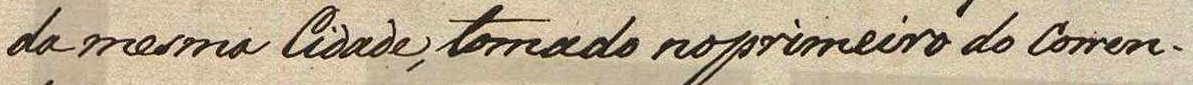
da mesma Cidade, tomado no primeiro do corren
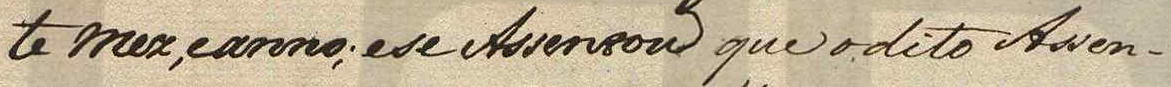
te mez, e anno; e se Assentou que o dito Assen
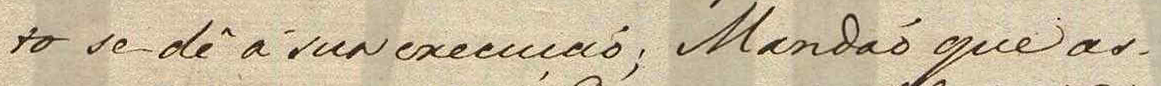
to se dê a sua execuçaõ; Mandaõ que as
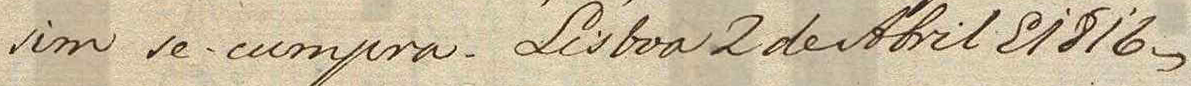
sim se cumpra. Lisboa 2 de Abril d̄ 1816
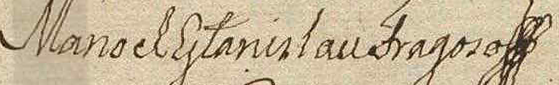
Manoel Estanislau Fragoso
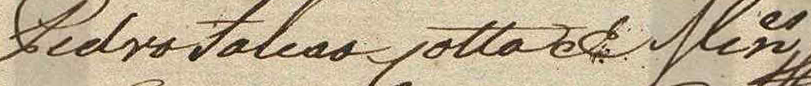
Pedro Falcao Cotta e Men.es
